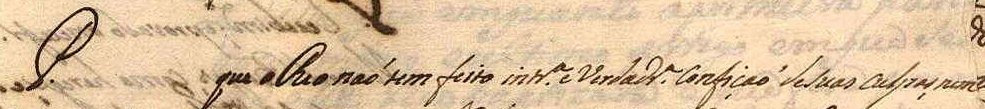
P. que o Reo naõ tem feito intr.a e verdadr.a confiçaõ de suas culpas nem
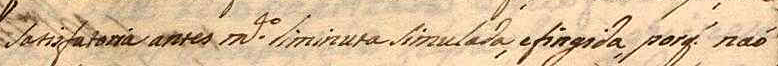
satisfatoria antes m.to diminuta simulada, e fingida, porq̄ naõ
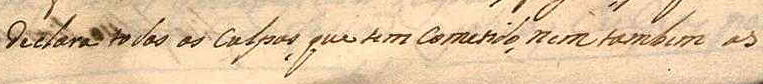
declara todas as culpas, que tem cometido, nem tambem as
